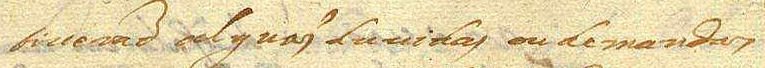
tiuerão alguas̄ duuidas, ou demandas
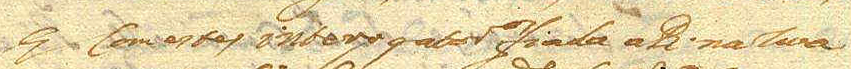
E Com estes interogator.os fiada a R. na sua
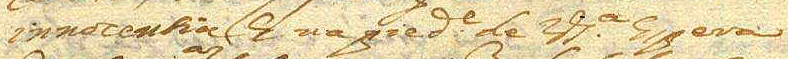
innocencia E na pied.e de VS.a Espera
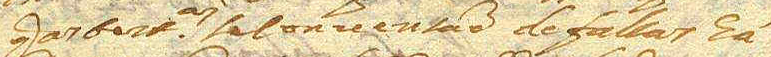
q̄ as test.as se conuensaõ de fallar E á
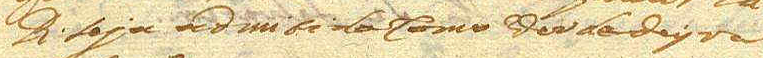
R. seja admitida Como verdadeyra
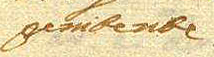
penitente
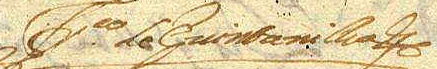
Fr.co de Quintanilha
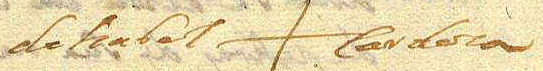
de Izabel + Cardoza
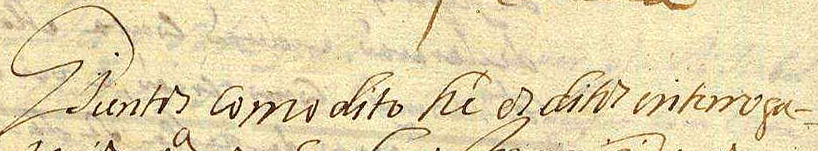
E Juntos como dito hé os ditos interroga
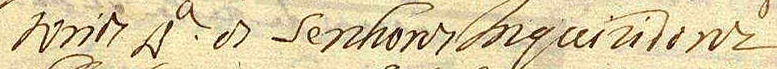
torios p.a os Senhores Inquizidorez
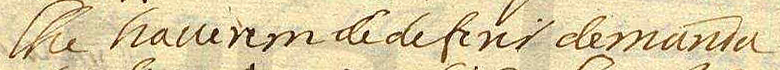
lhe hauerem de deferir demanda
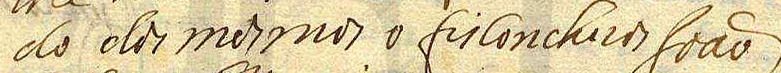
do dos mesmos o fis concluzos Joaõ
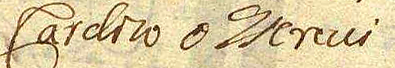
Cardozo o Escreui
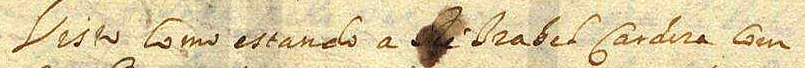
Visto como estando a Ré Izabel Cardoza com
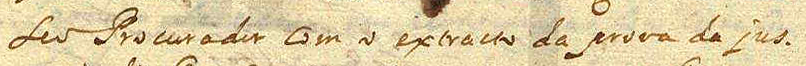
seo Procurador com o extracto da prova da jus
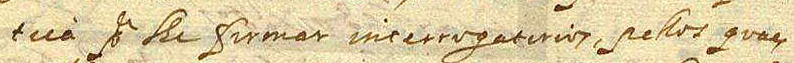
tiça p.a lhe formar interrogatorios, pellos quaes
